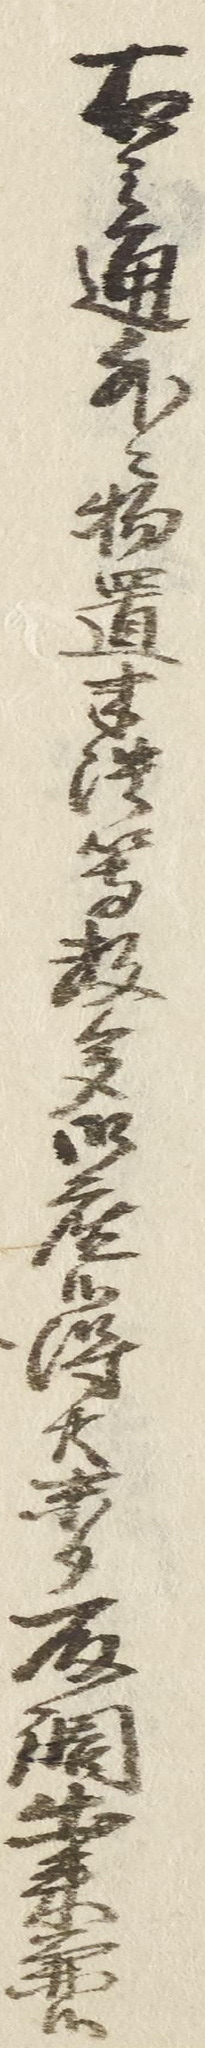右之通外二物置半潰等数多御座候得共未タ取調出来兼候
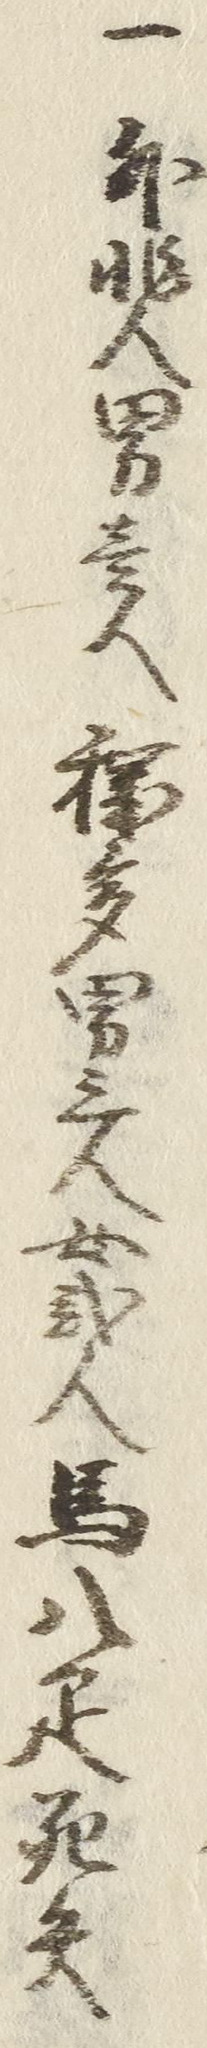一外非人男壱人穢多男三人女弐人馬八疋死失
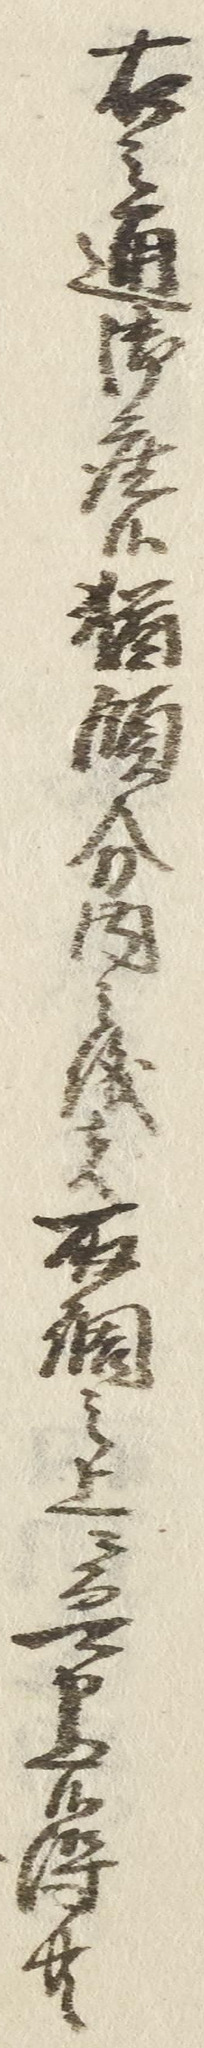右之通御座候猶餘分之儀は取調之上二而可申候得共
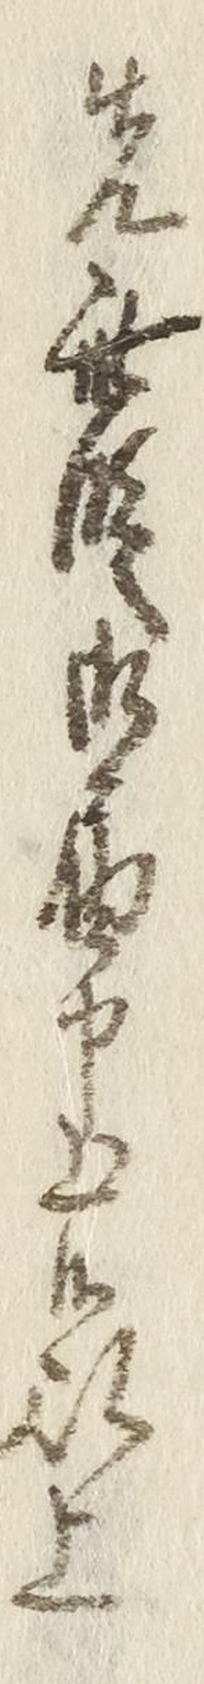先此段御届申上候以上
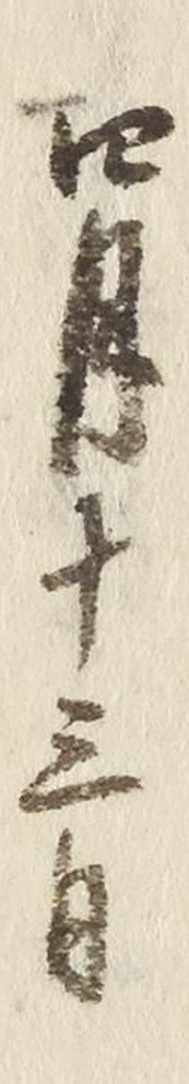四月十三日
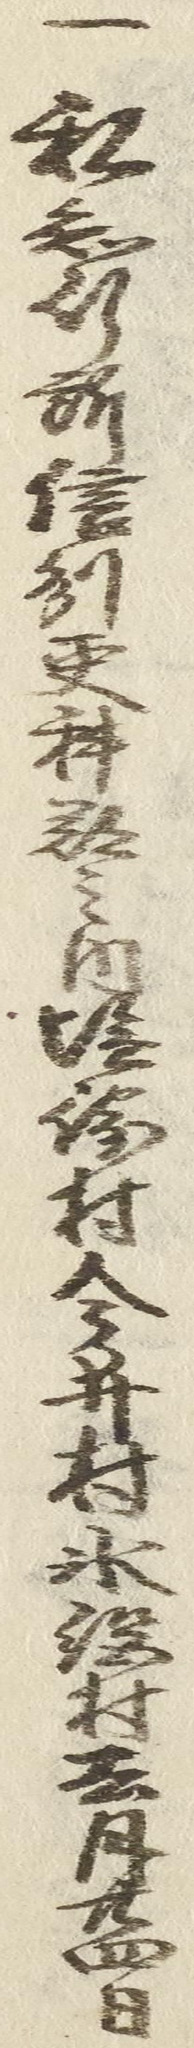一私在所信州更級郡之内塩崎村今井村氷絶村去月廿四日
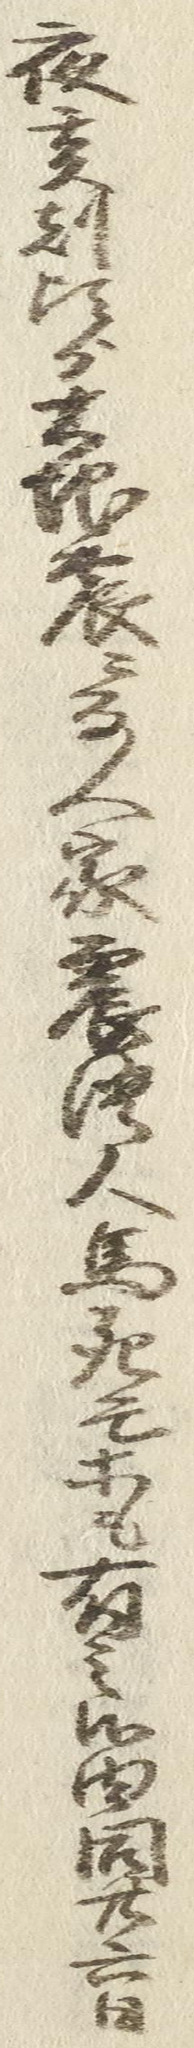夜亥刻頃ゟ大地震二而人家震潰人馬死亡等も有之候由同廿六日
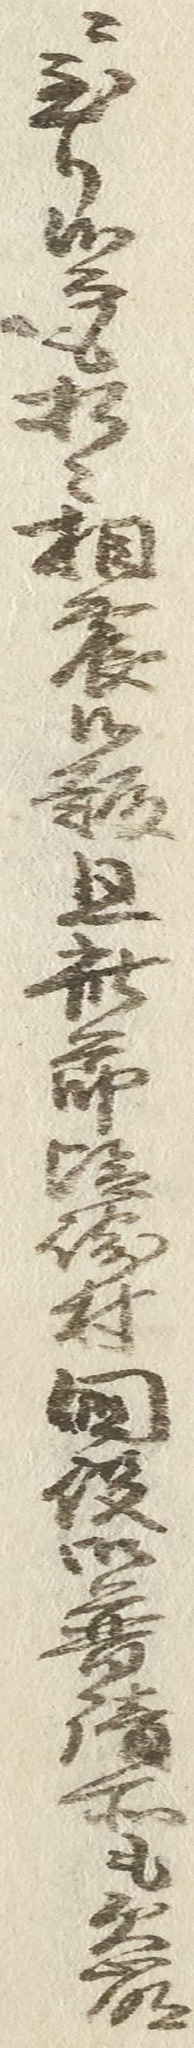二至り候而も折々相震候趣且此節塩崎村国役御普請所も欠崩
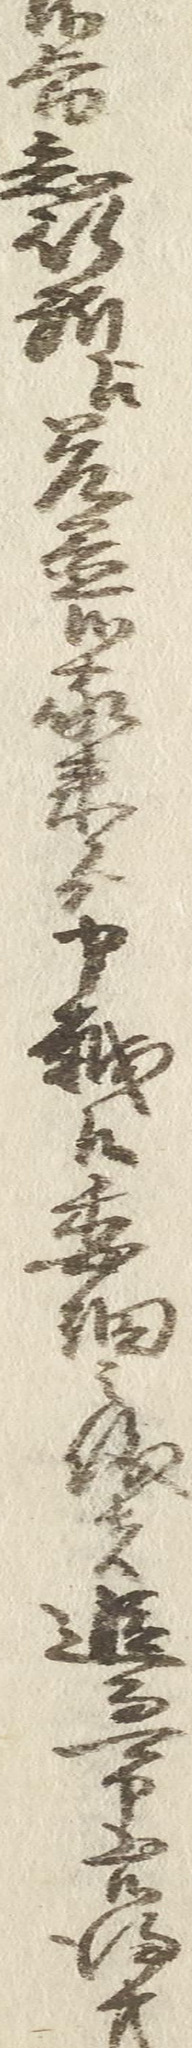候旨知行所江差置候家来ゟ申越候委細之儀は追而可申上侯得共
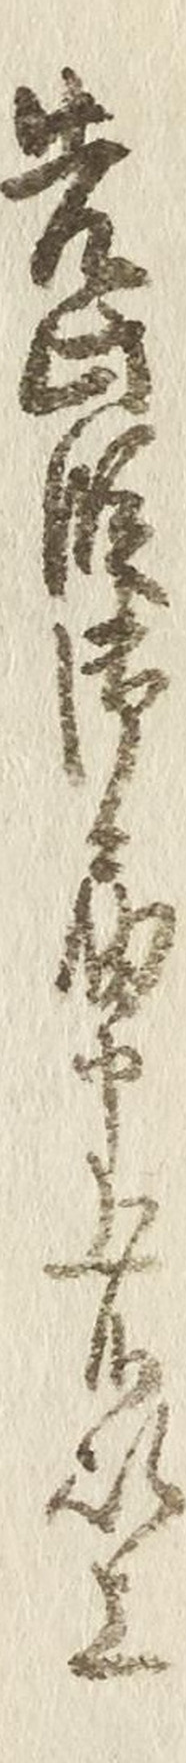先此段御届申上候以上
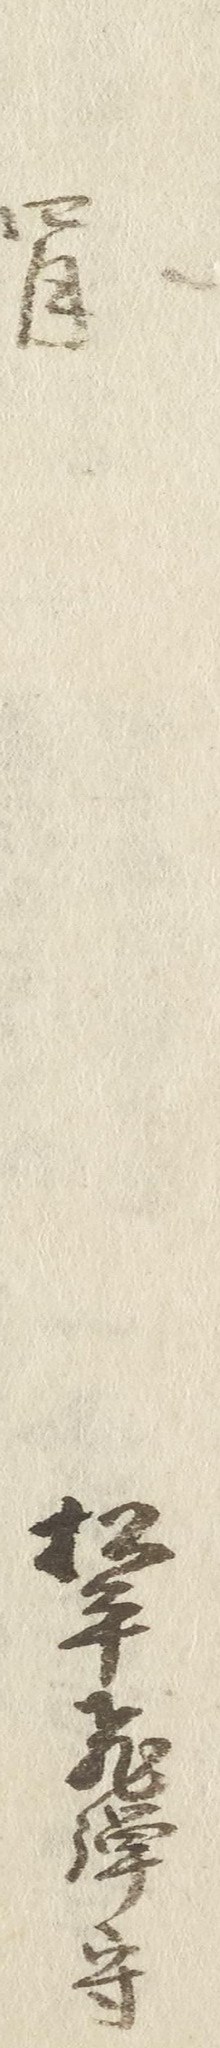四月松平飛騨守
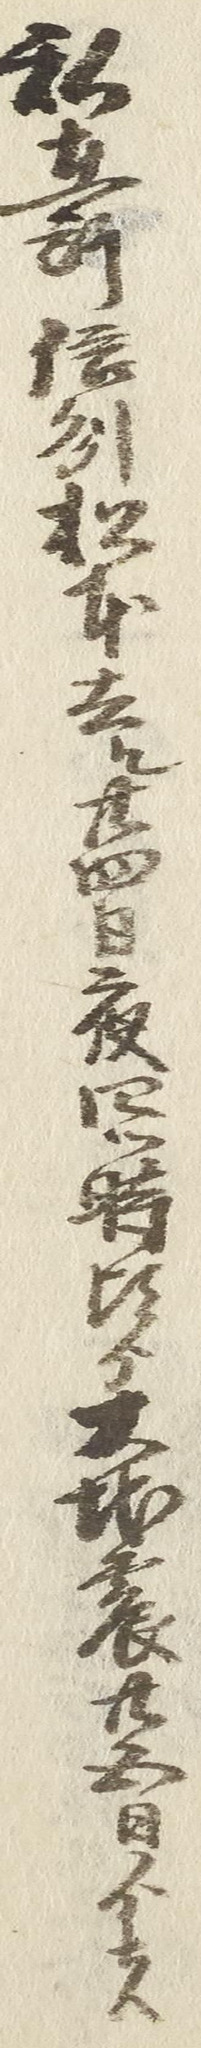私在所信州松本去ㇽ廿四日夜四ッ時頃ゟ大地震廿五日ゟは
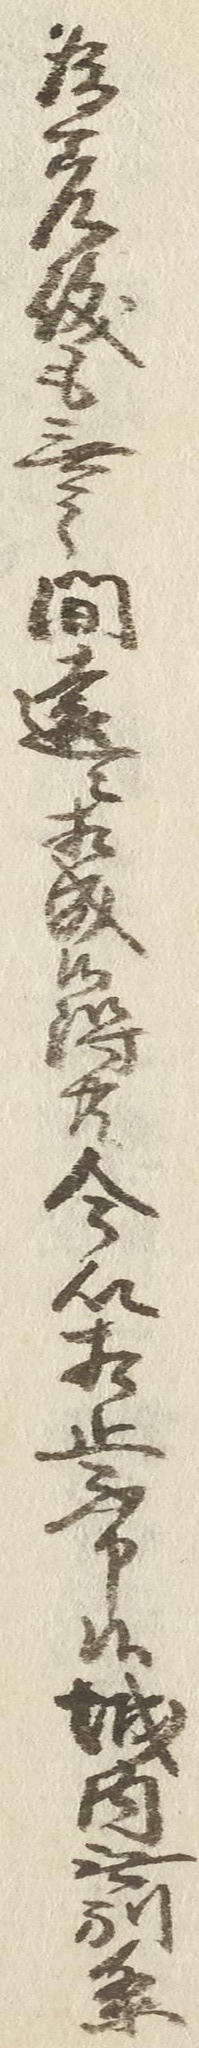為差儀も無之間遠二相成候得共今以相止不申候城内無別条
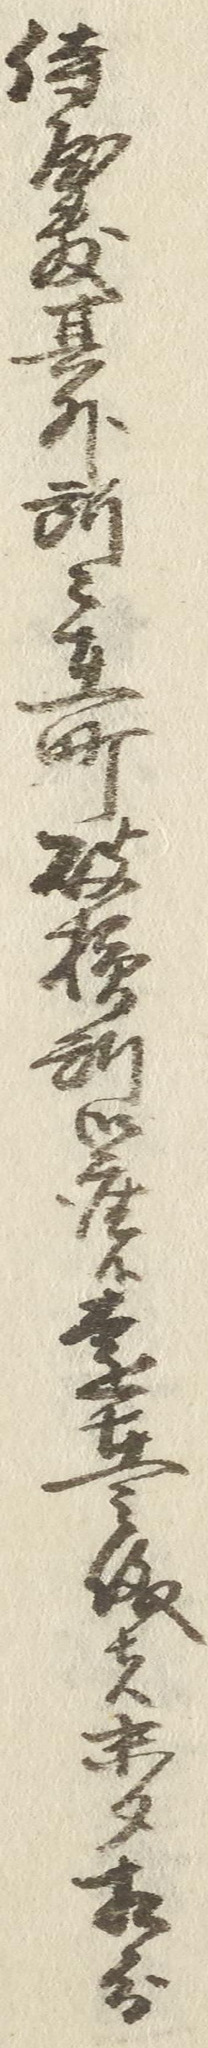侍屋敷其外所々在町破損所御座候遠在之儀は未タ相分
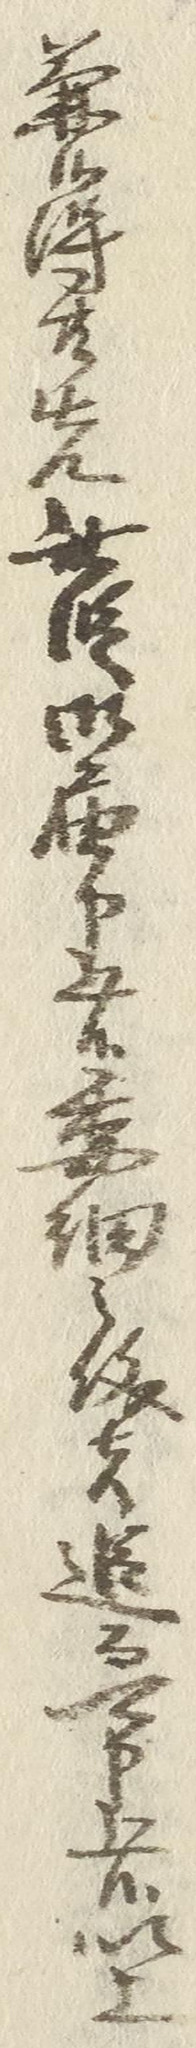兼候得共先此段御届申上候委細之儀は追而可申上候以上
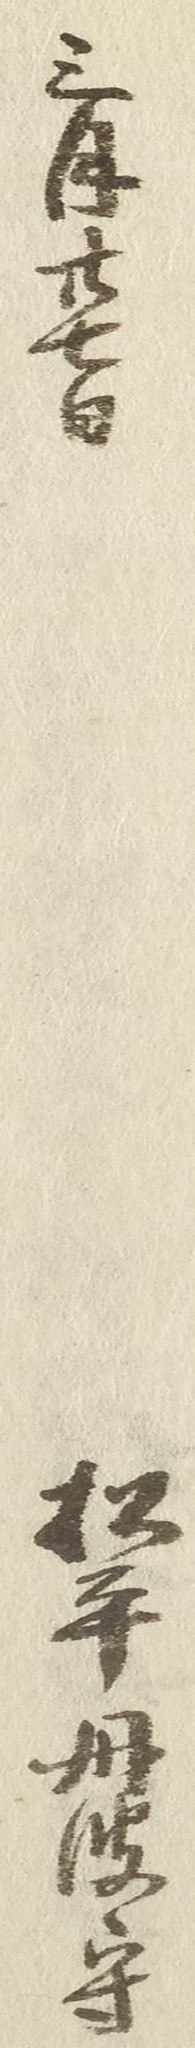三月廿七日松平丹波守
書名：従往古地震御届書記誌之一
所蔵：東京大学地震研究所図書室 Earthquake Research Institute Library, The University of Tokyo, JAPAN
